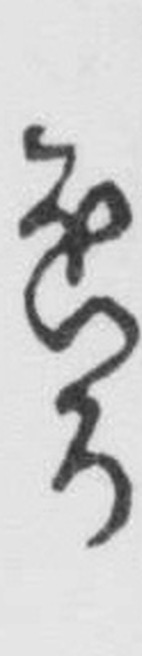ほいろ
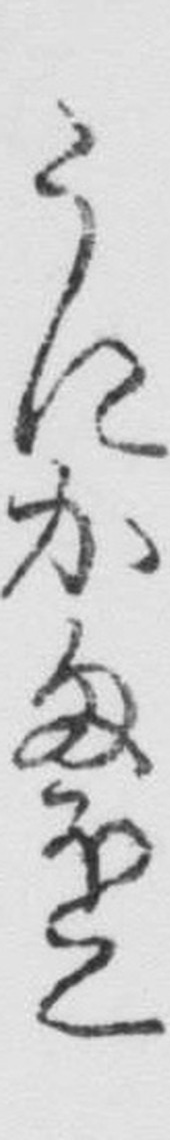うにかまほこ
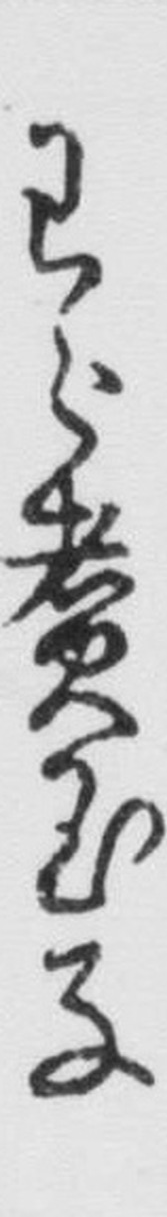わら煮玉子
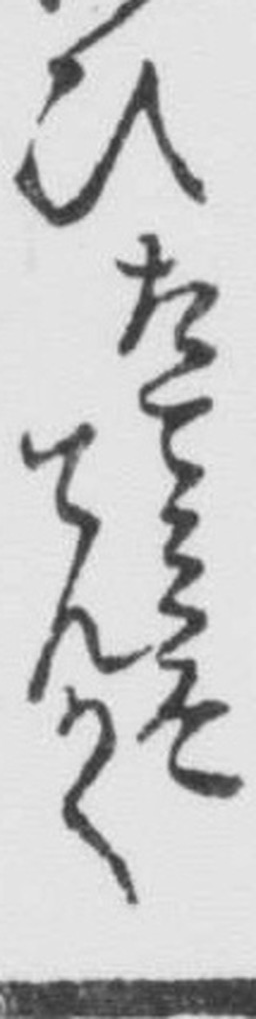てんかく
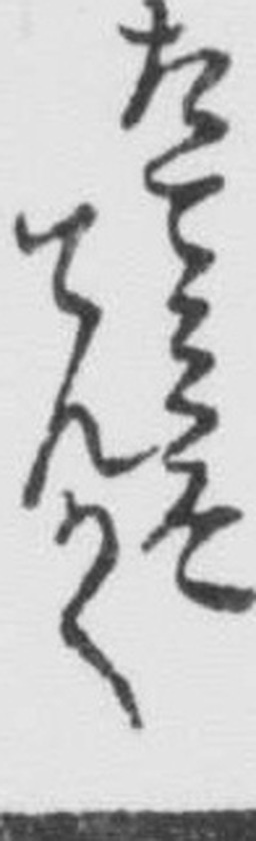てんかく
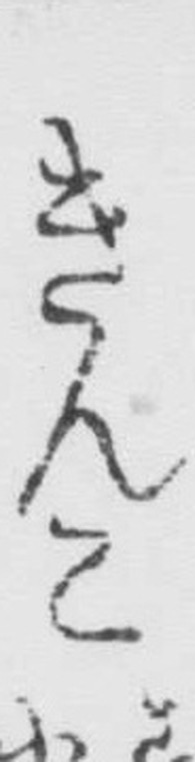きすこ
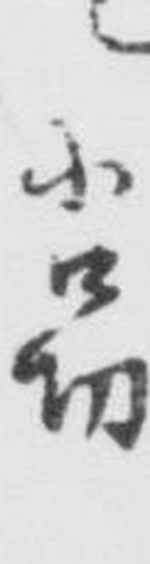小口切
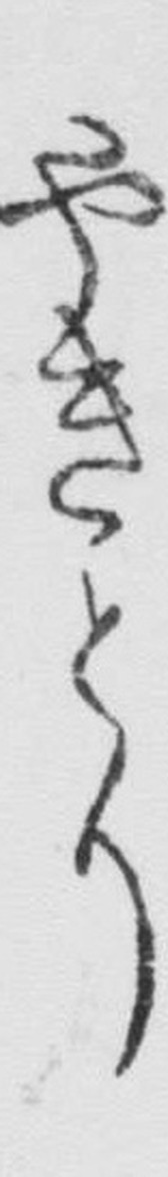やきとり
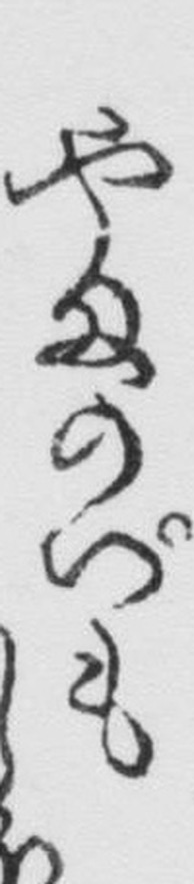やまのいも
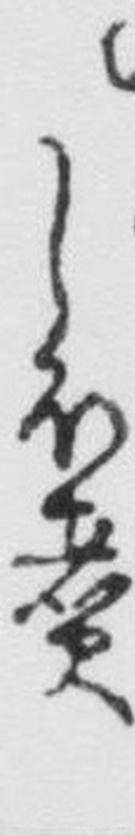しほ煮
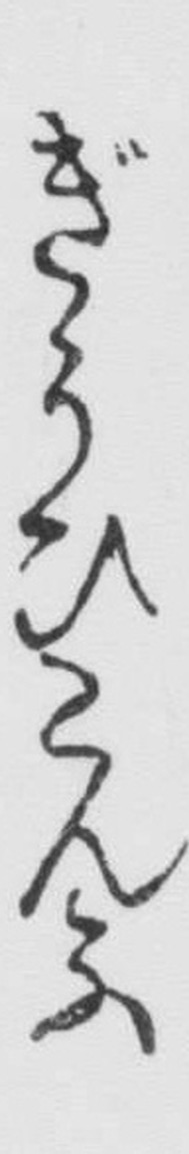ぎうひこんふ
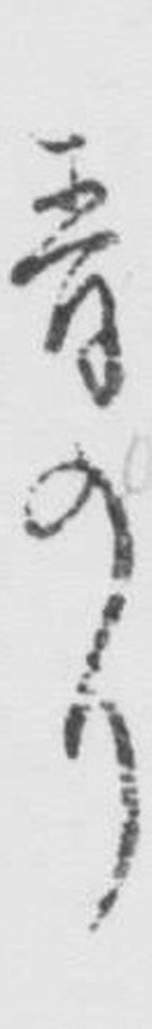青のり
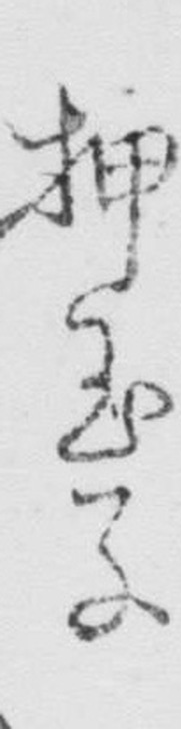押玉子
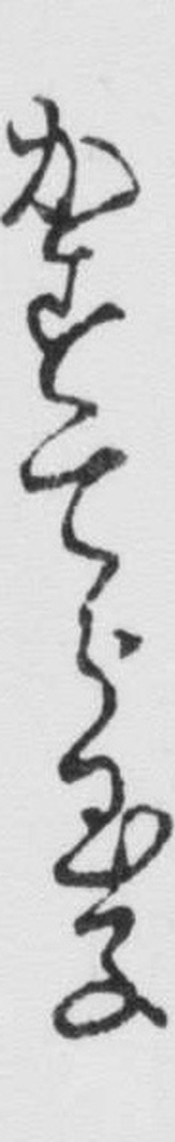かすてら玉子
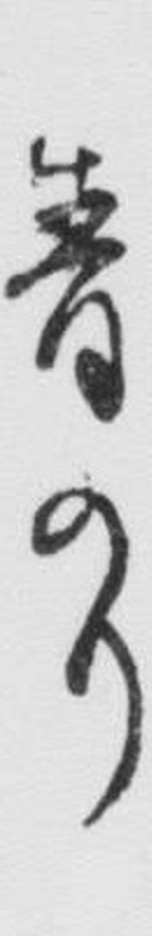青のり
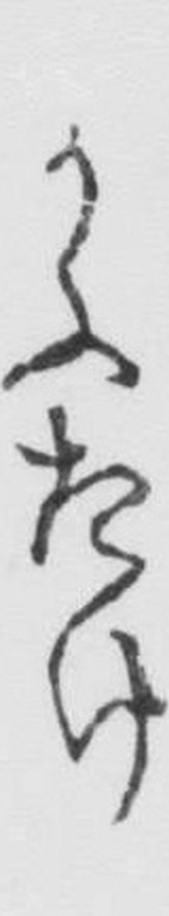かふたけ
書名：諸家通用/即席料理
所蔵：大阪府立大学学術情報センター 国文学研究資料館
